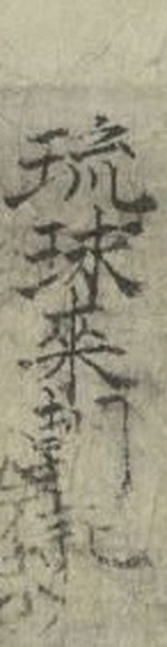琉球来朝記
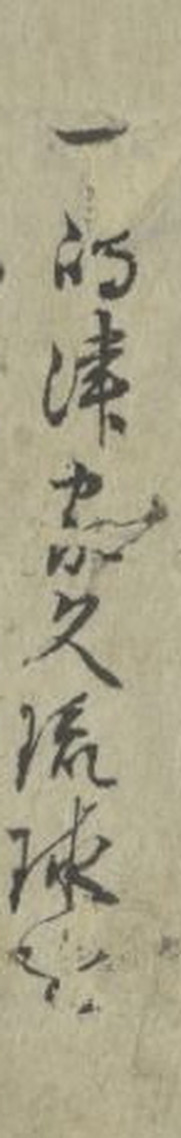一島津家久琉球を
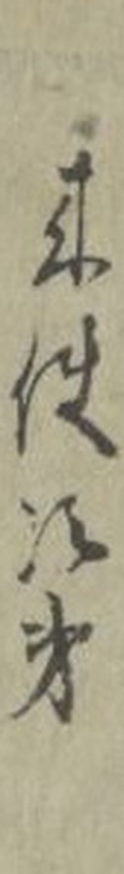来使次第
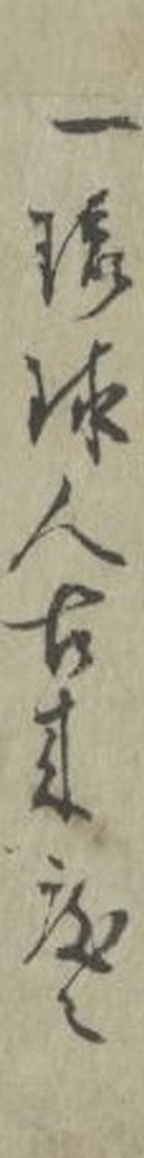一琉球人古来度々
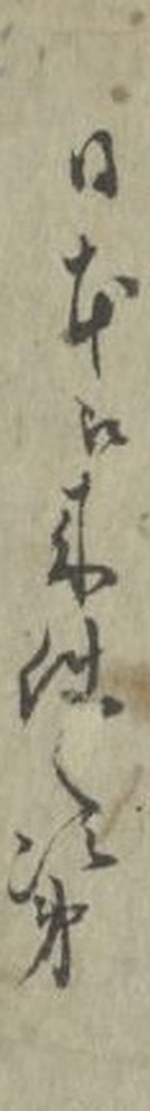日本え来使之次第
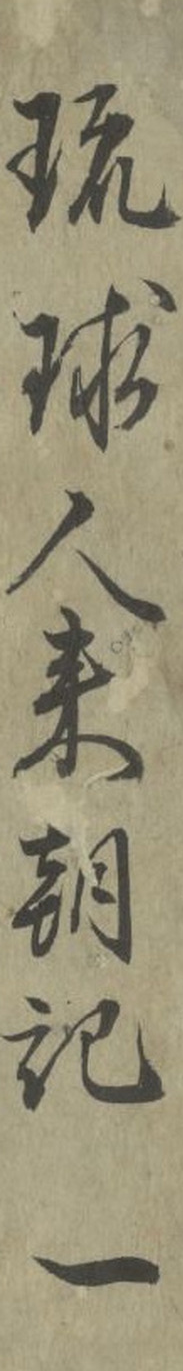琉球来朝記一

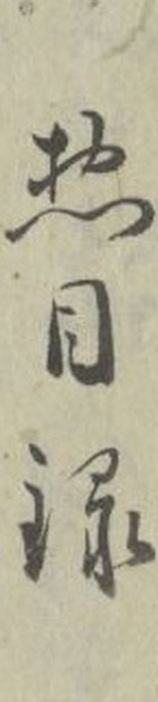惣目録
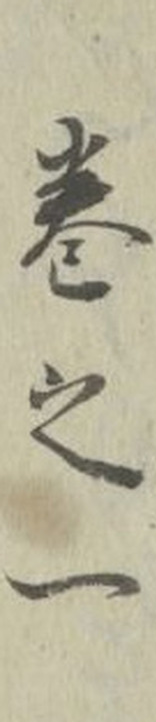巻之一
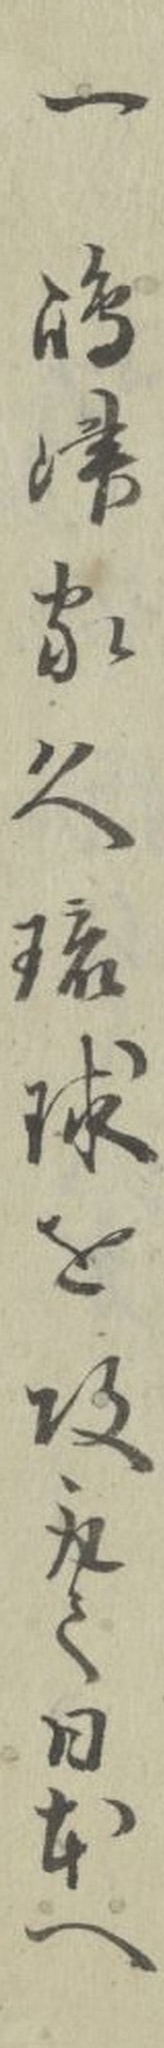一島津家久琉球を攻取て日本へ
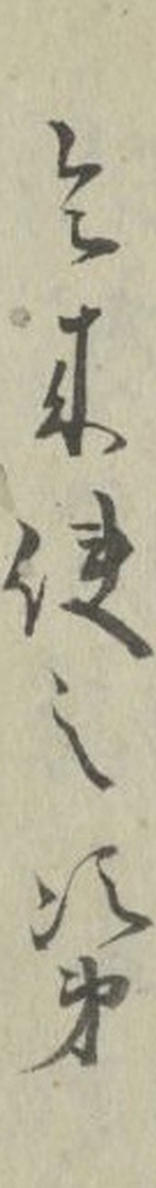令来使之次第
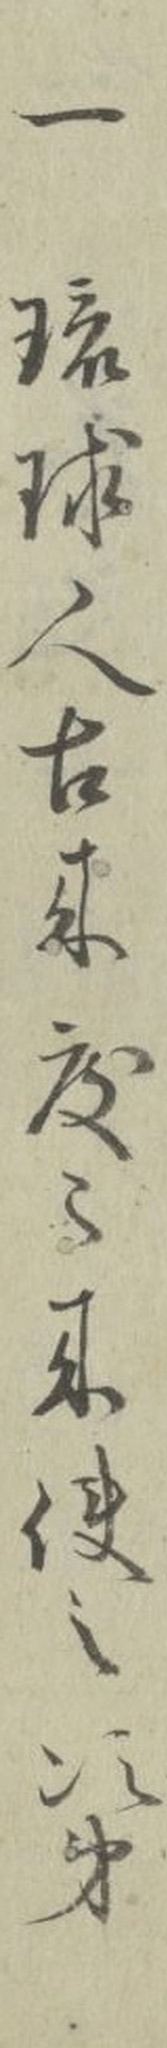一琉球人古来度々来使之次第

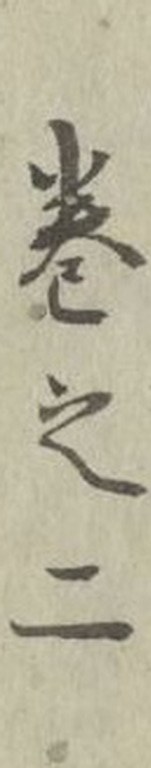巻之二
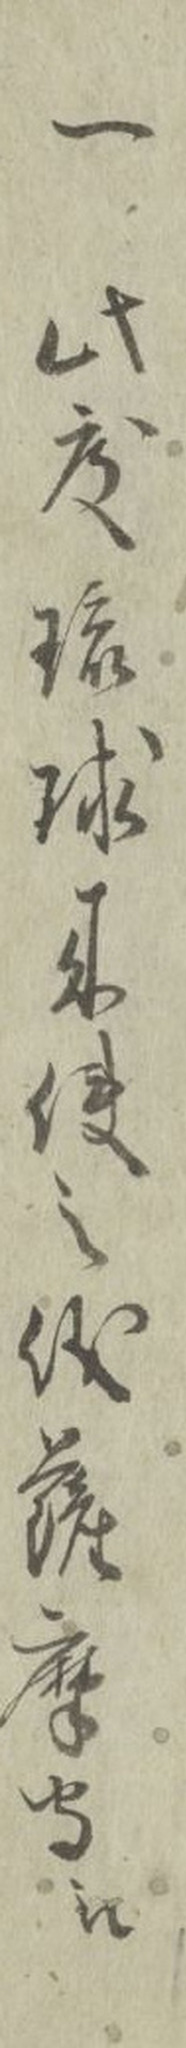一此度琉球来使之儀薩摩守え
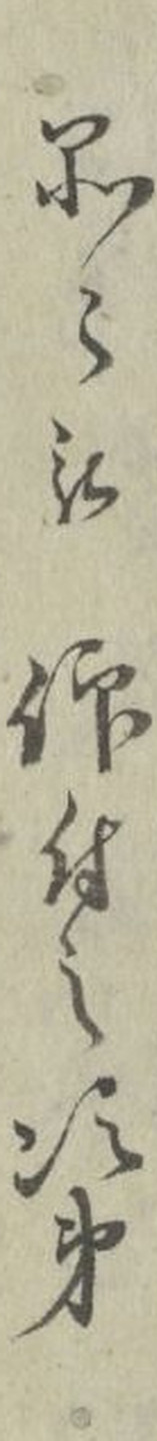品々被仰付之次第
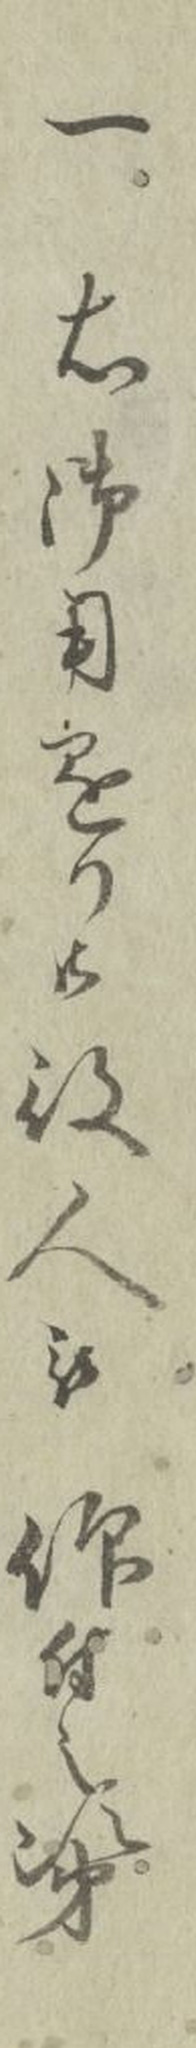一右御用懸り御役人被仰付之次第
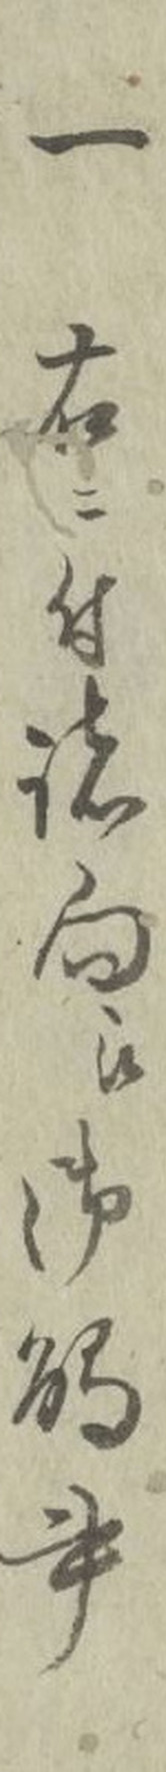一右に付諸向え御触書
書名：琉球来朝記 自一至七
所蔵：University of the Ryukyus Library
